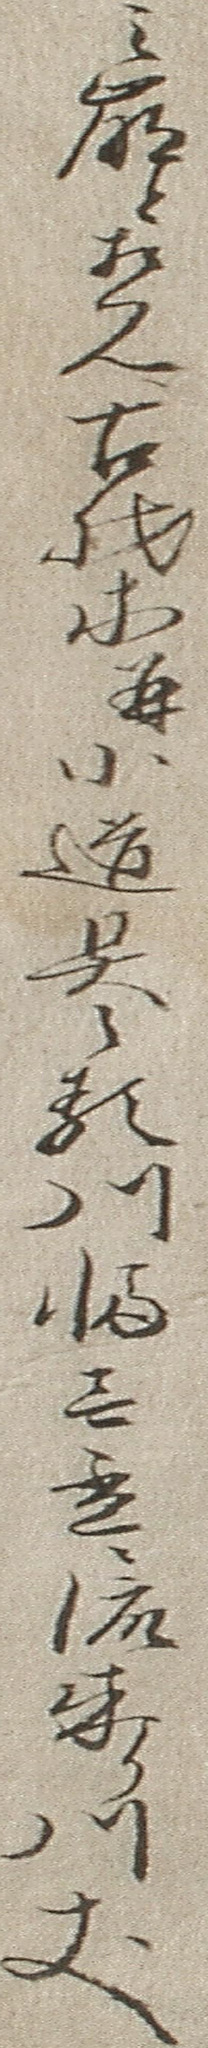之崩と相見古材木并小道具之類川幅壱盃に流来り川丈
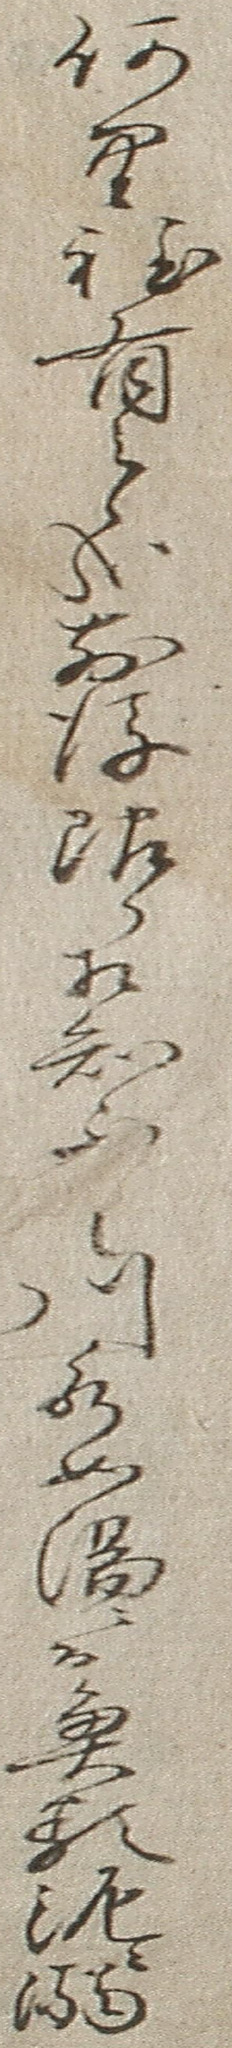何里程有之候哉前後限り相知不申候川水如湯に而魚類泥に溺
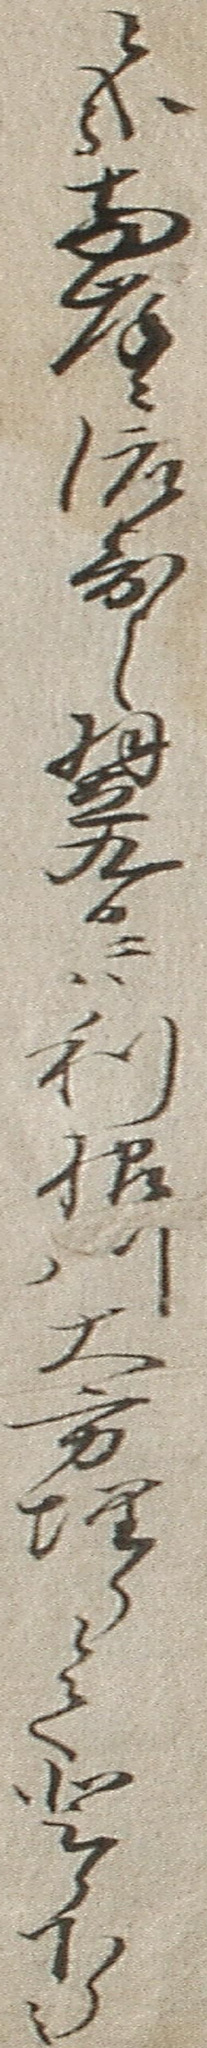候哉両岸に流寄申候翌九日には利根川大方埋り候て登り下り之
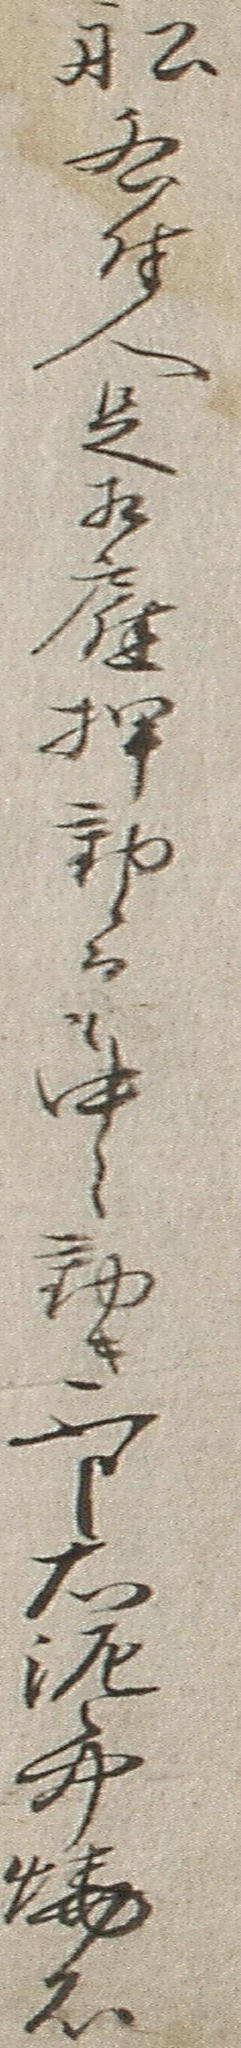船右付人足相雇押動にても中々動き不申右泥之中焼石
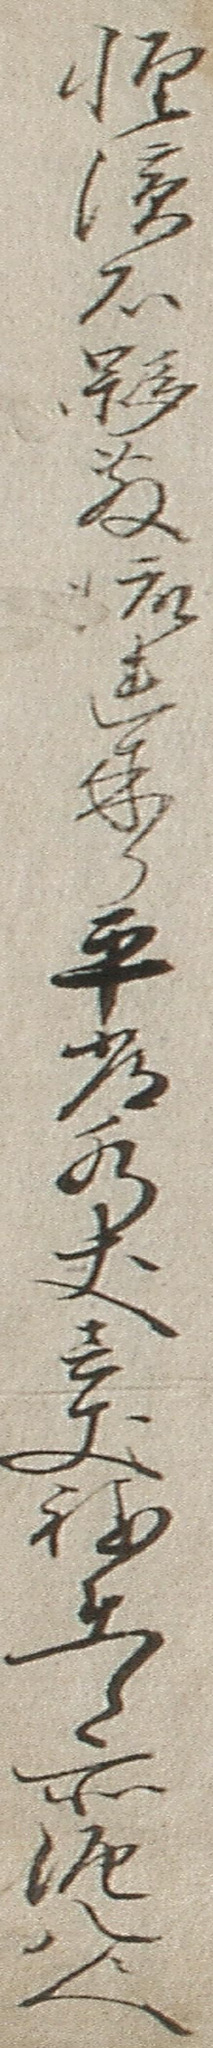軽浜石夥敷流来り平常水丈壱丈程在候所泥八尺

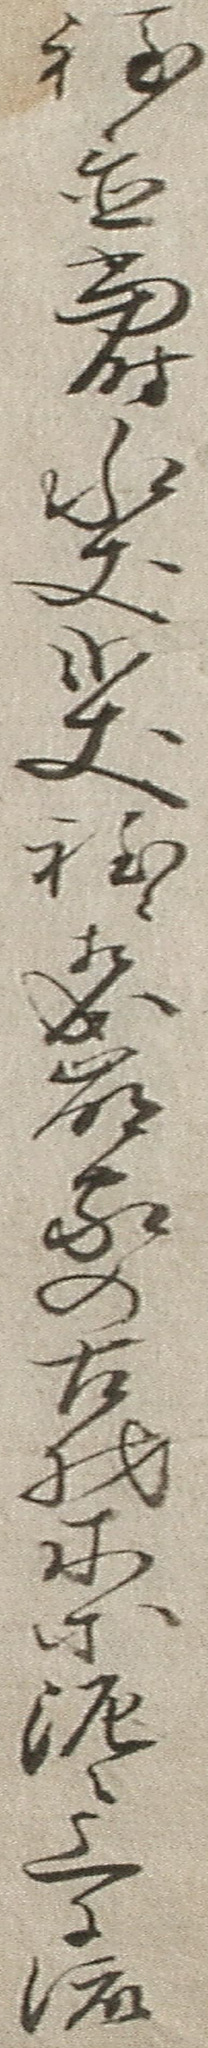程置当時水丈弐丈程に相成崩家の古材木等泥之上に流
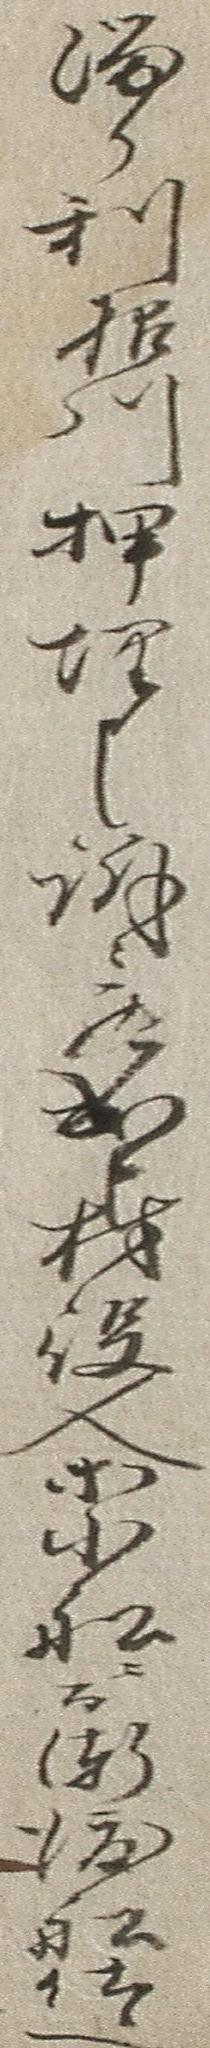溜り利根川押埋申候訴に罷出申村役人等小船に而漸渡船仕候へ共
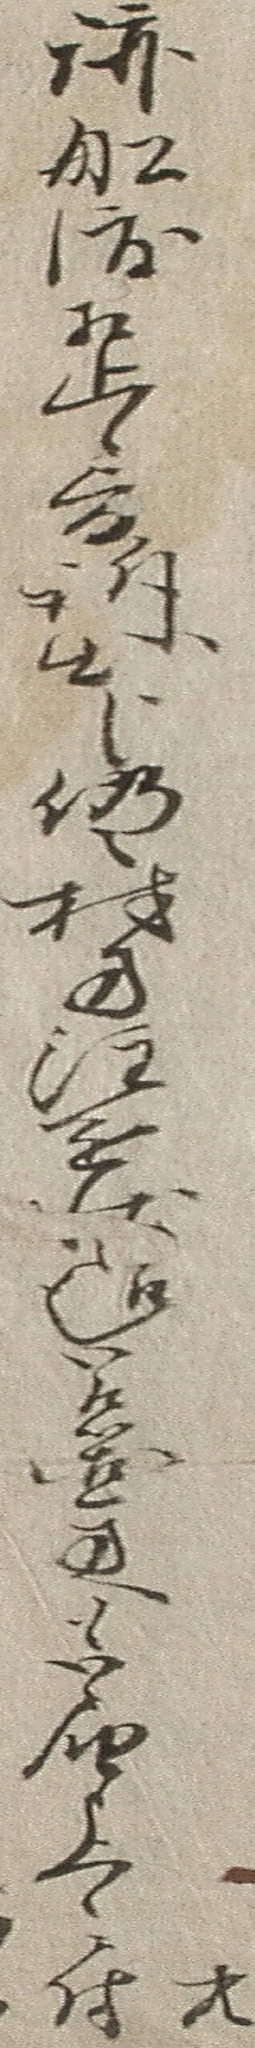跡船渡相止候旨訴出申候仍之村方注進状之趣御取箇方へも御届申上候に付
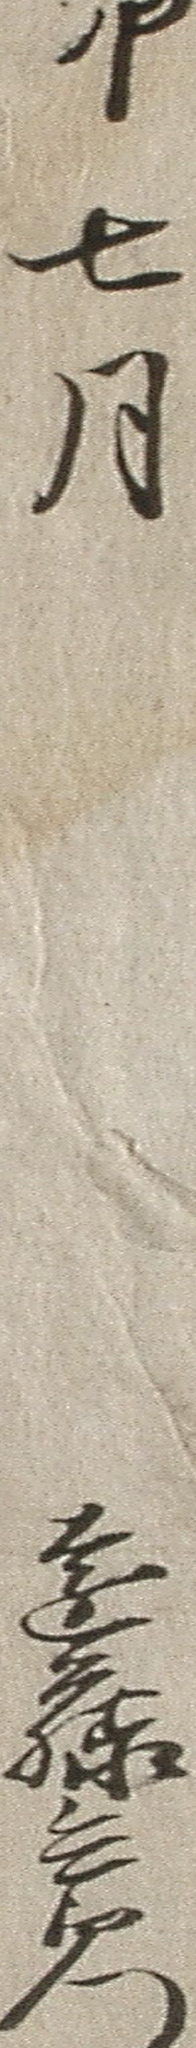卯七月遠藤兵右衛門
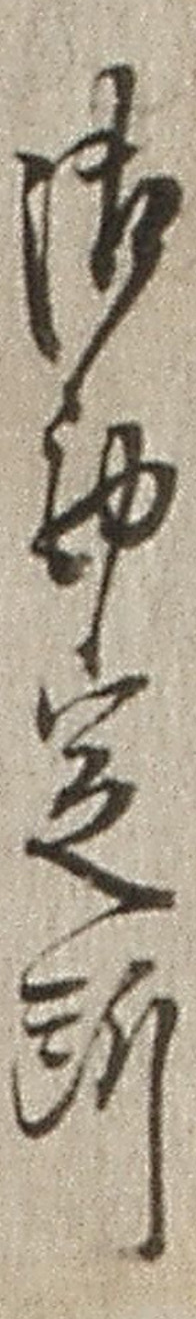御勘定所
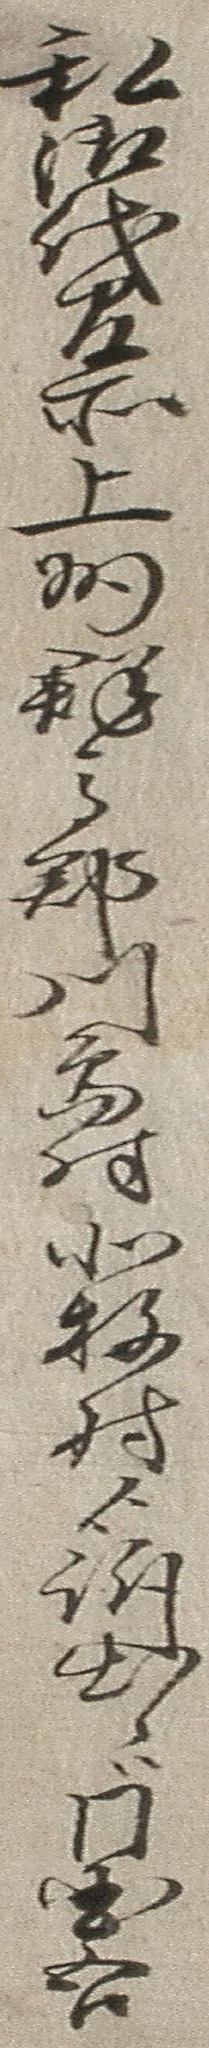私御代官所上州群馬郡川島村北牧村ゟ訴出候は同国吾
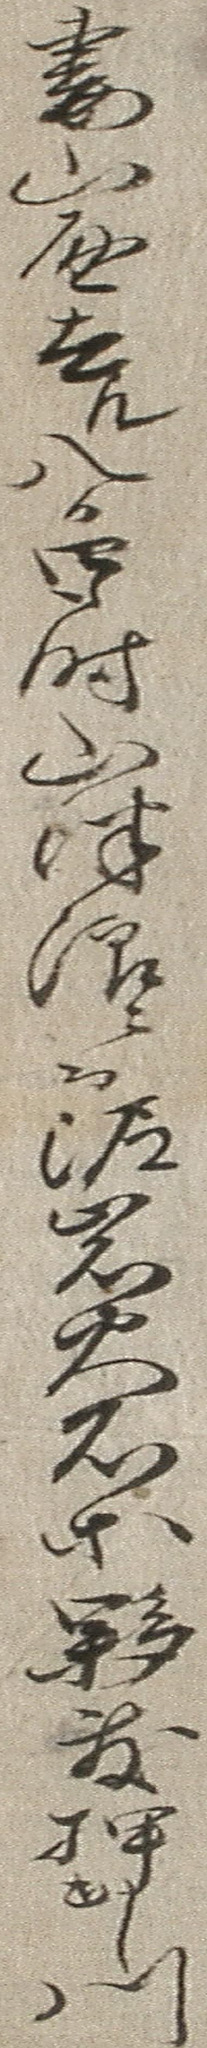妻山通去ル八日四ッ時山津浪に而泥岩火石等夥敷押出し川
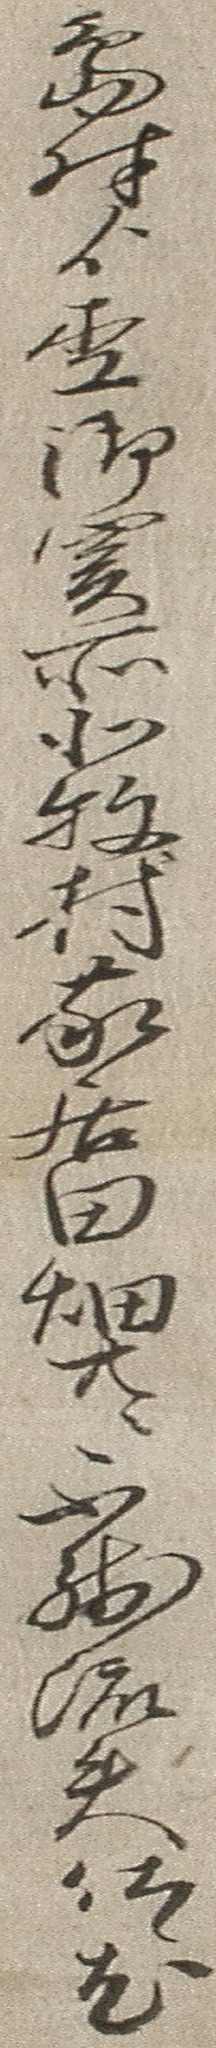島村ゟ杢御関所北牧村家居田畑共に不残流失仕候尤
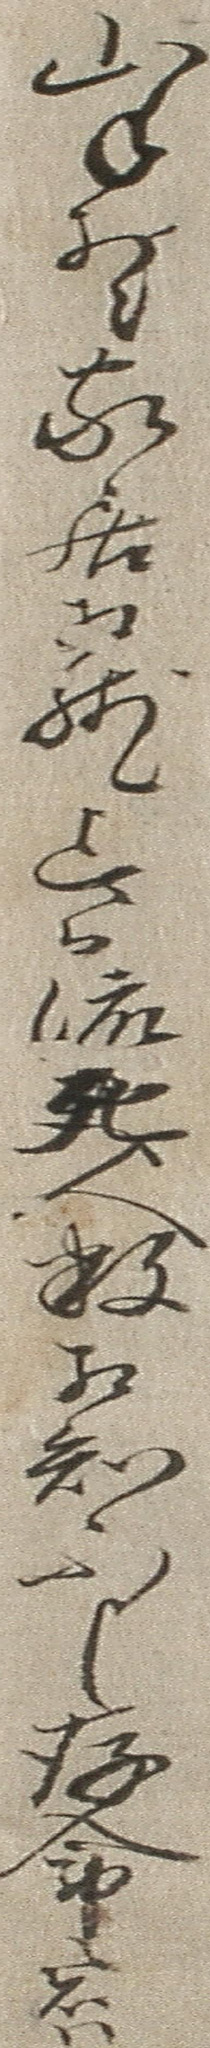山手少し家居相残候迄に而流死人数相知不申候存命之者は
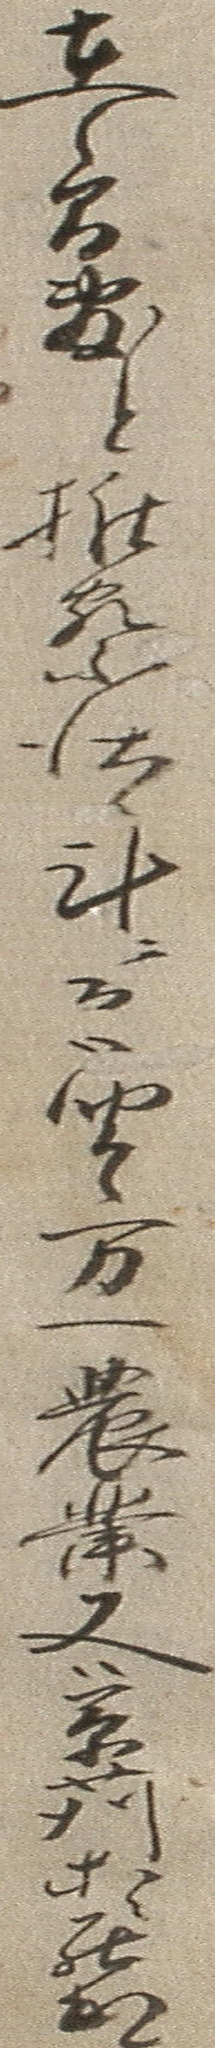在之間敷候と推察仕候斗に而御座候万一農業又は草苅等に罷出候
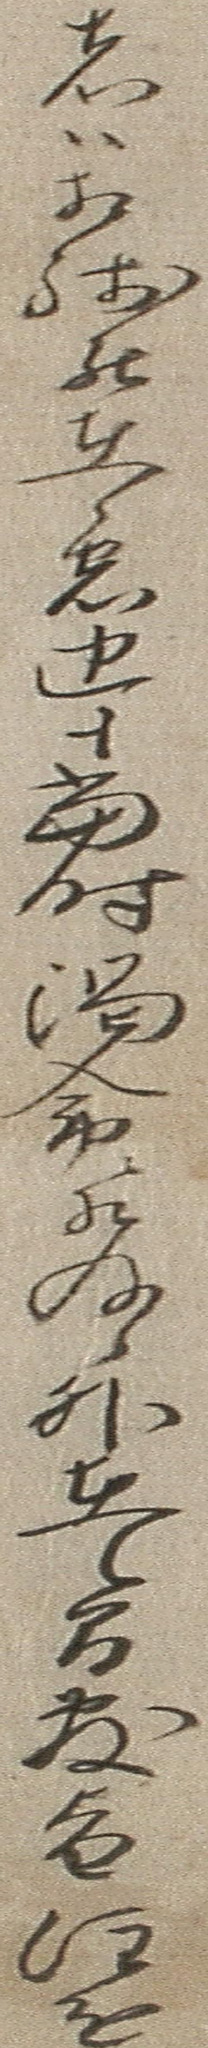者は相残罷在候者迚も当時渇命に相及候外在之間敷旨注進
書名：太平秘録抜書　浅間山燒及普賢山崩
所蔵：東京大学地震研究所図書室 Earthquake Research Institute Library, The University of Tokyo, JAPAN
